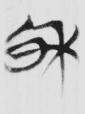{日禾}
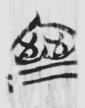{宀臸}
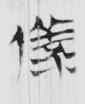備
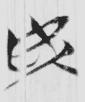𡚦
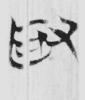取
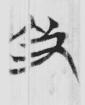及
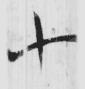七
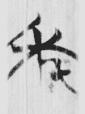年
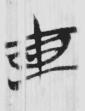車
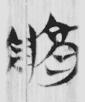{爿兔}
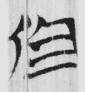於
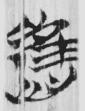舊
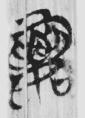{婁口}
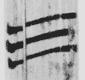三
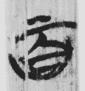百
